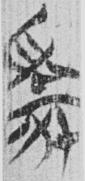○（家）
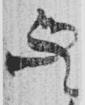父
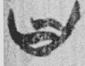曰
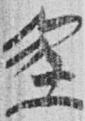○（吾）
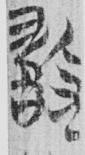敢
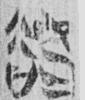欲
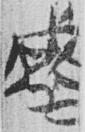○（顑）
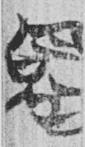○（頷）
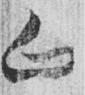㠯（以）
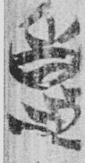事
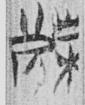殜（世）
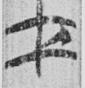哉
